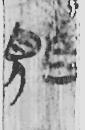{見？}
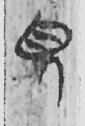見
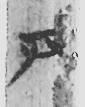四
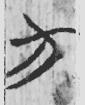方
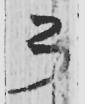乃
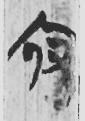府
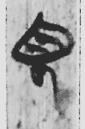見
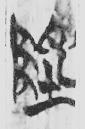地（地）
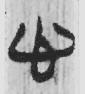心
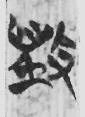毀
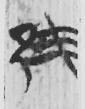隹
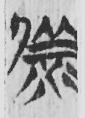備
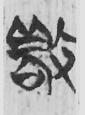敬
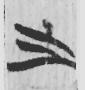之
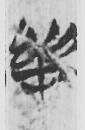𪪋（哉）
